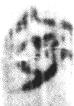序
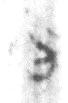心
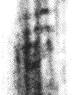司
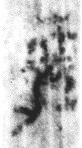鹿
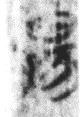腸
